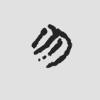勿
